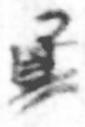爲
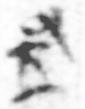○（右）
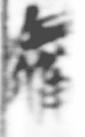○（服）
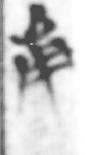甫
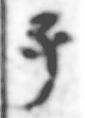子
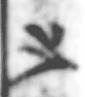之
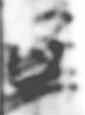爲
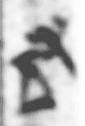○（右）
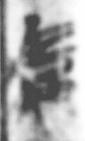驂
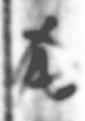犬
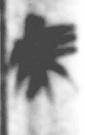馬
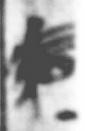駟
